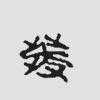發
